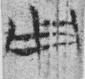用
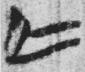亡（无）
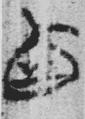○（攸）
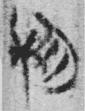利
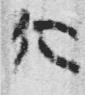六
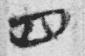四
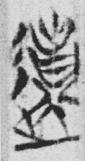○（顛）
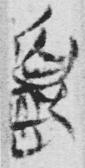頤
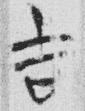吉
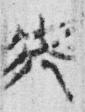虎
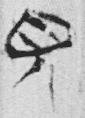見（視）
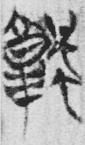眈眈
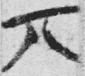亓（其）
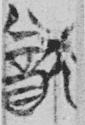猶
